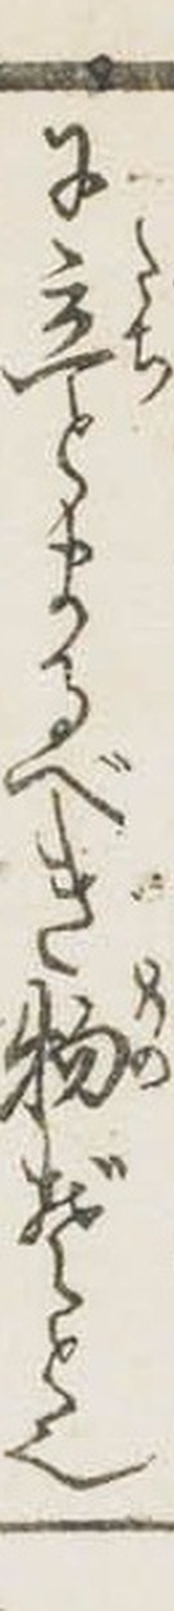に立とまるべき物ぞと也
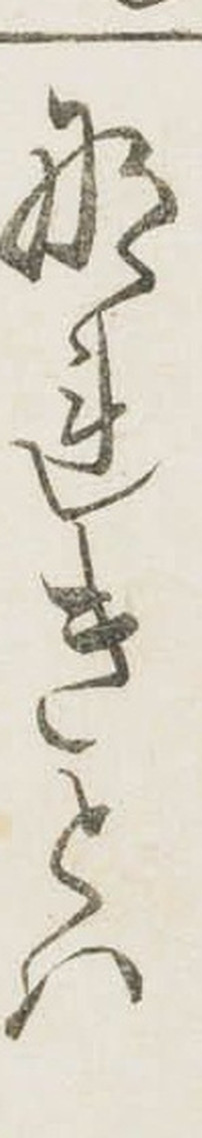なれきとは
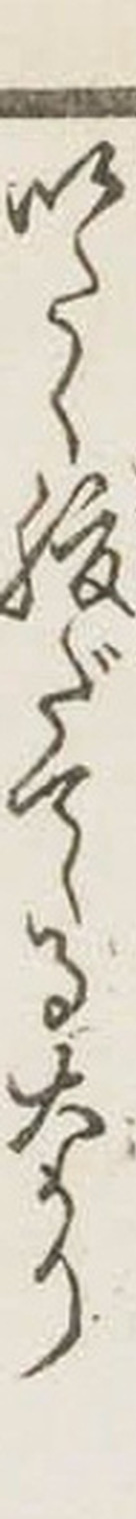いたく腹だてるなり
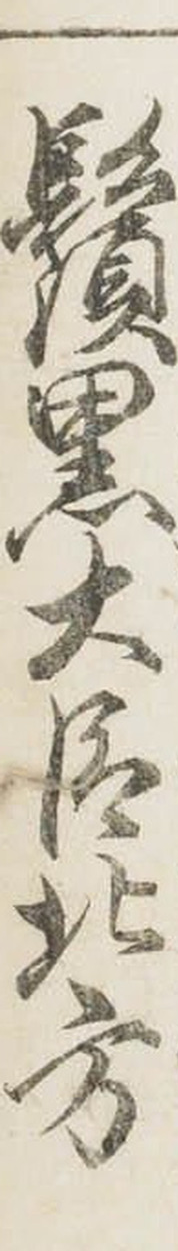鬚黒大臣北方
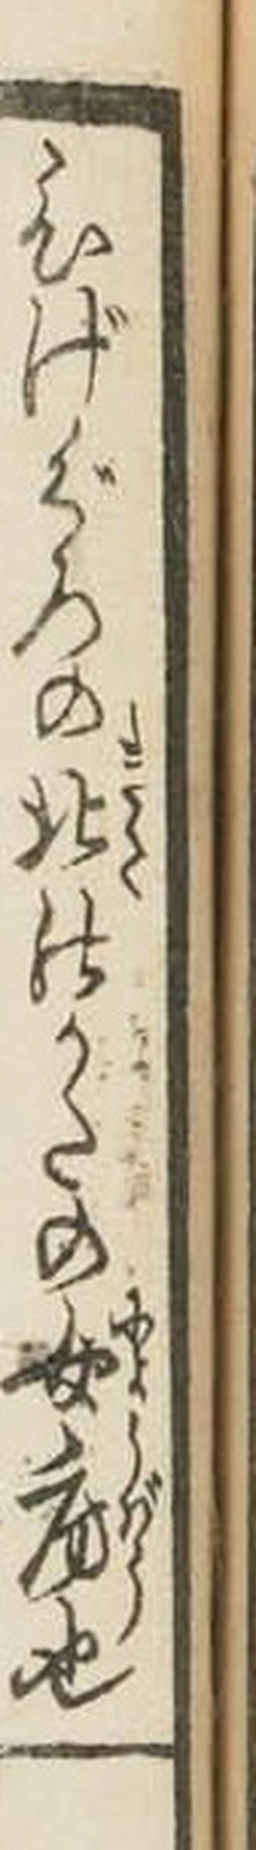ひげぐろの北のかたの女房也
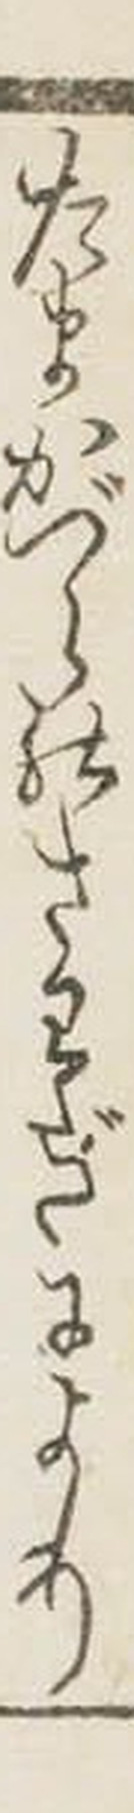たまかづらのさわぎにより
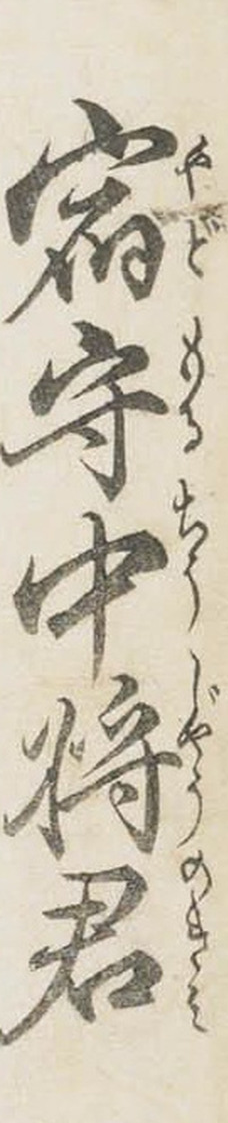宿守中将君
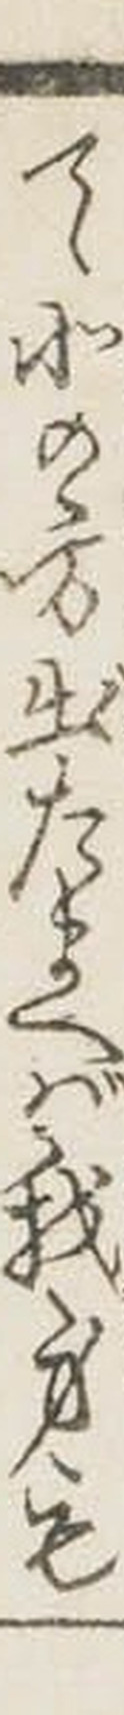て北の方出たまへば我身も
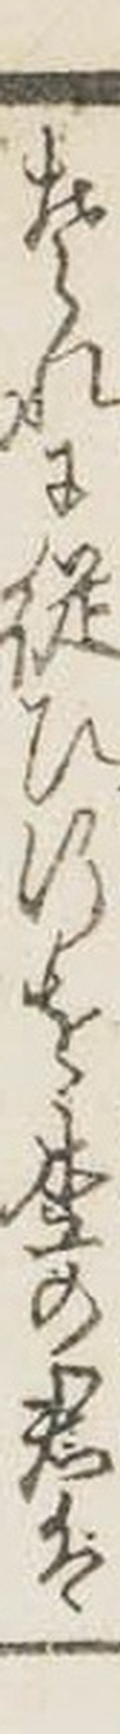それに従ひ行を杢の君は
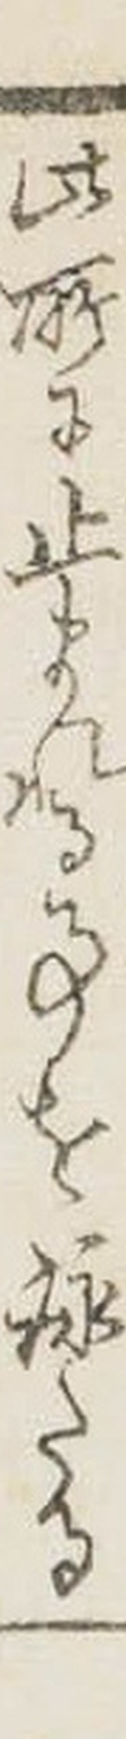此所に止まれる事を詠たる
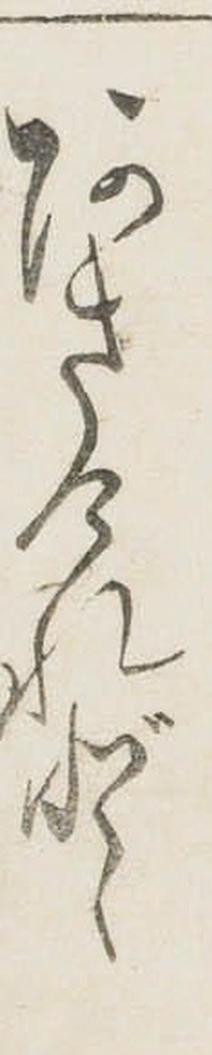あきけれど
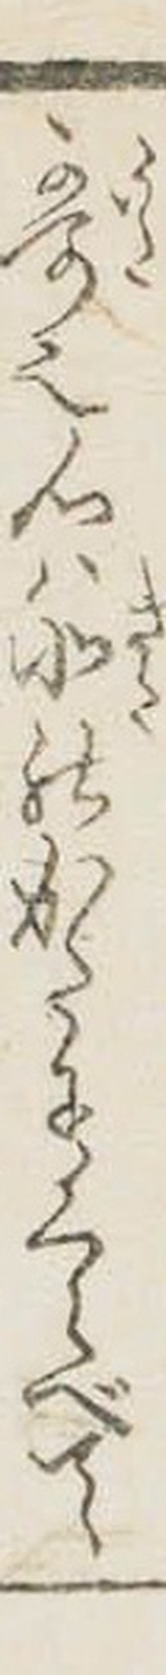哥也心は北のかたにくらべて
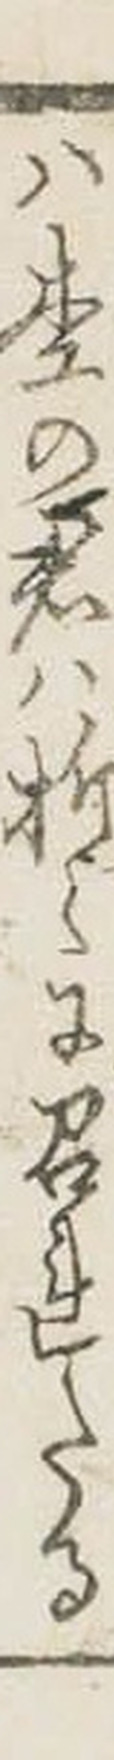は杢の君は折々に召れたる
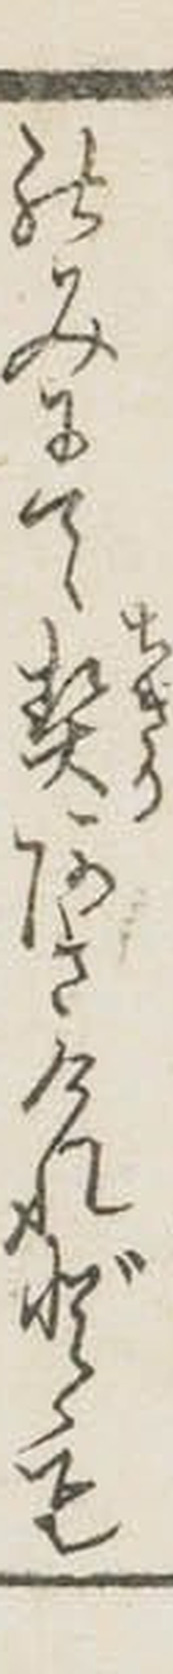のみにて契あさけれども
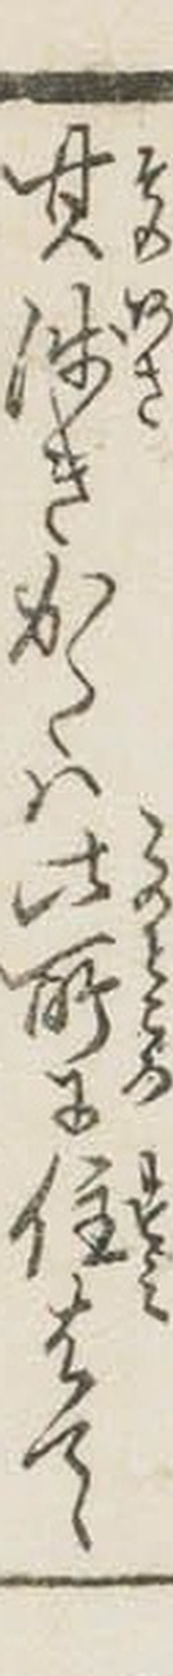其浅きかたは此所に住はて
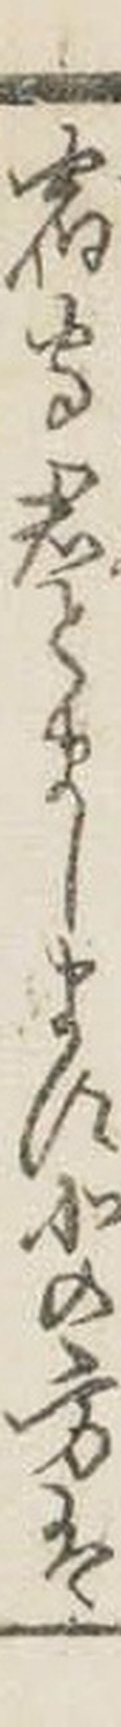宿守君とまします北の方は
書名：源氏百人一首
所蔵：東京学芸大学教育コンテンツアーカイブ
